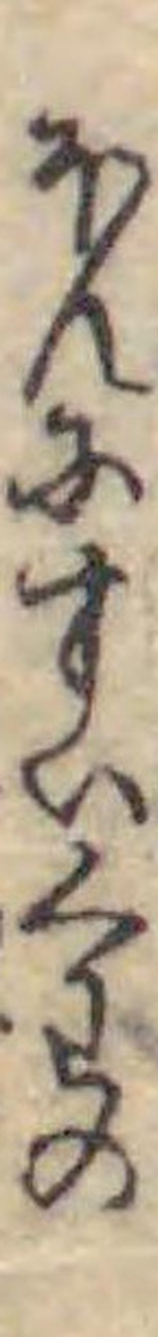ほんにすいくわの
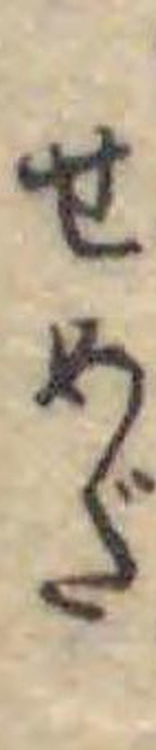せめだ
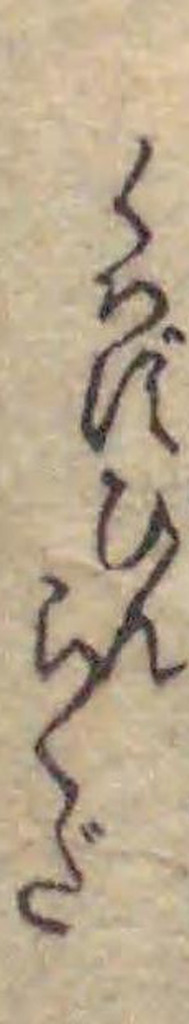くはずひん
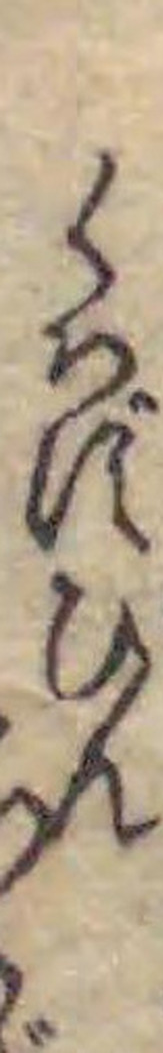くはずひん
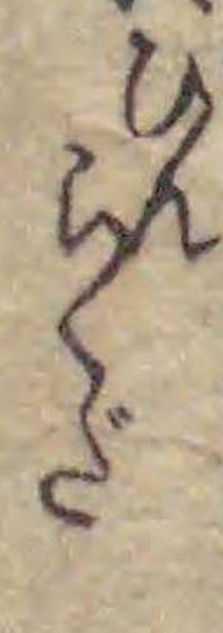らくだ

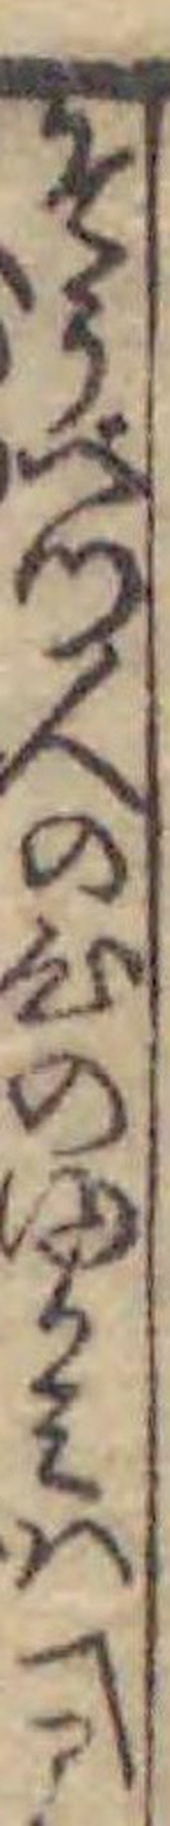そうべつ人の心のゆかみは
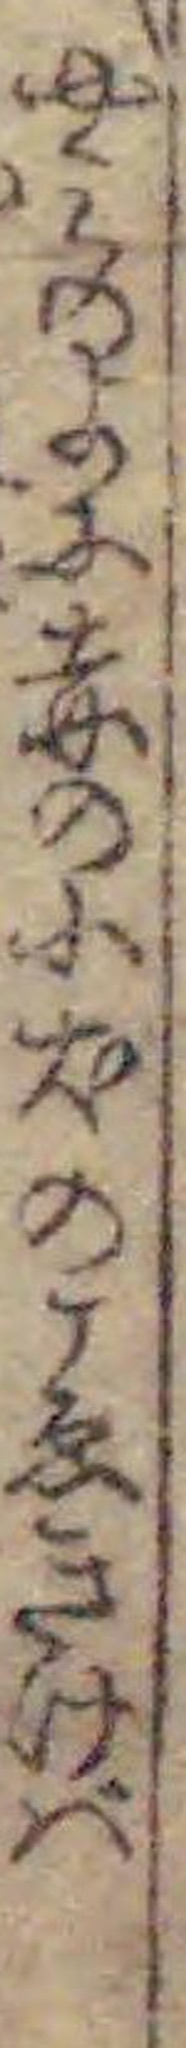〽やみのよに赤の小犬のこゑきけば
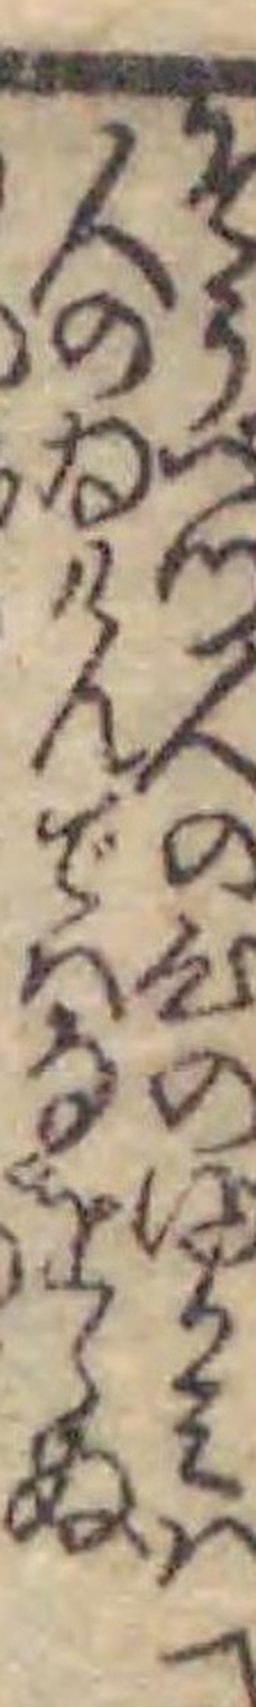人のゐんけんではなをらぬ
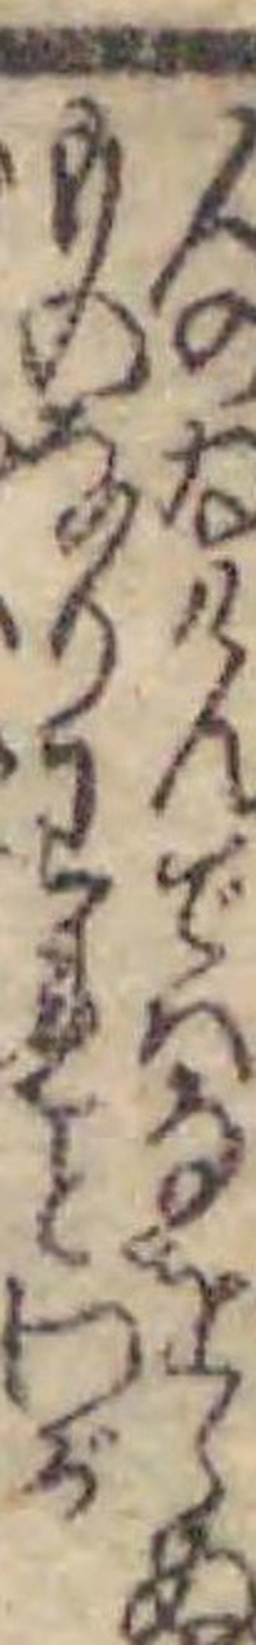ものなりわれとわが
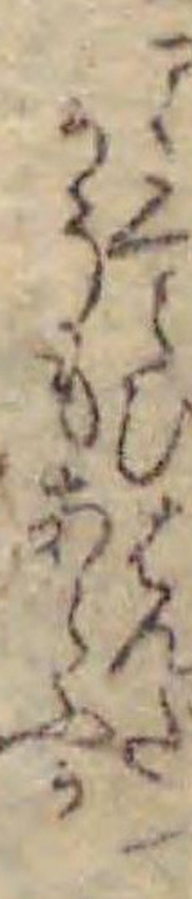かうもあらふか
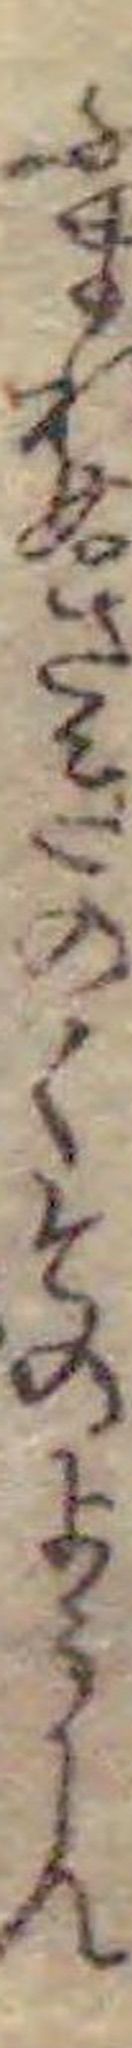ふまれぬさきのくそのようしん
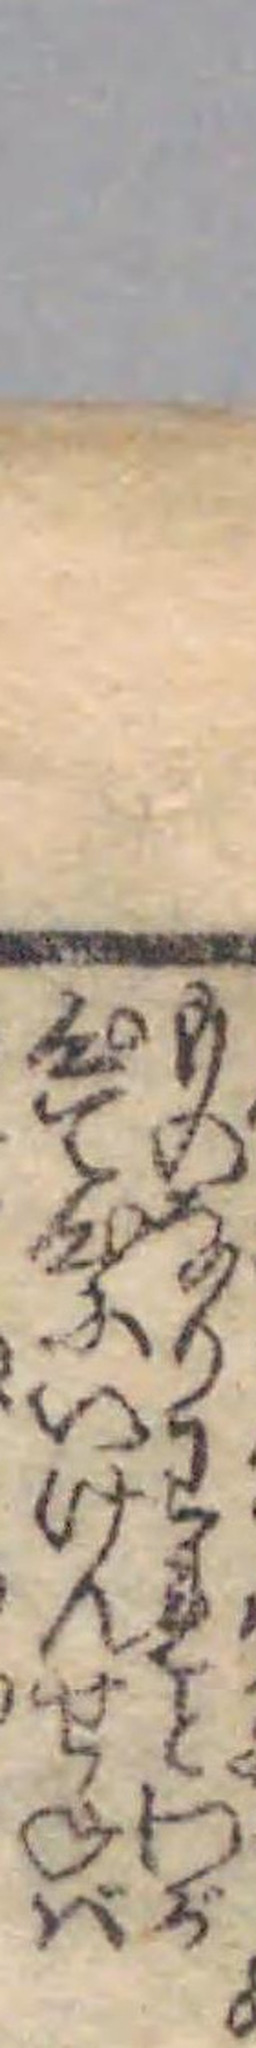心て心にいけんせねば
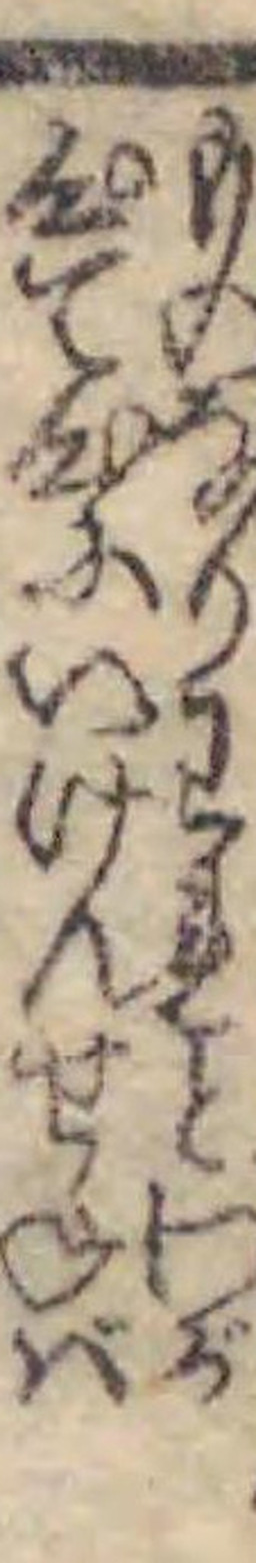心て心にいけんせねば
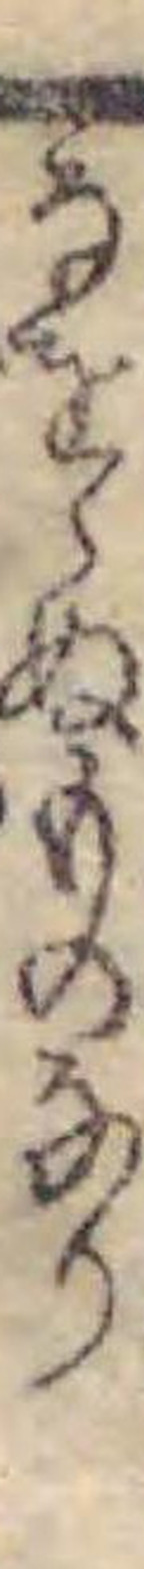なをらぬものなり
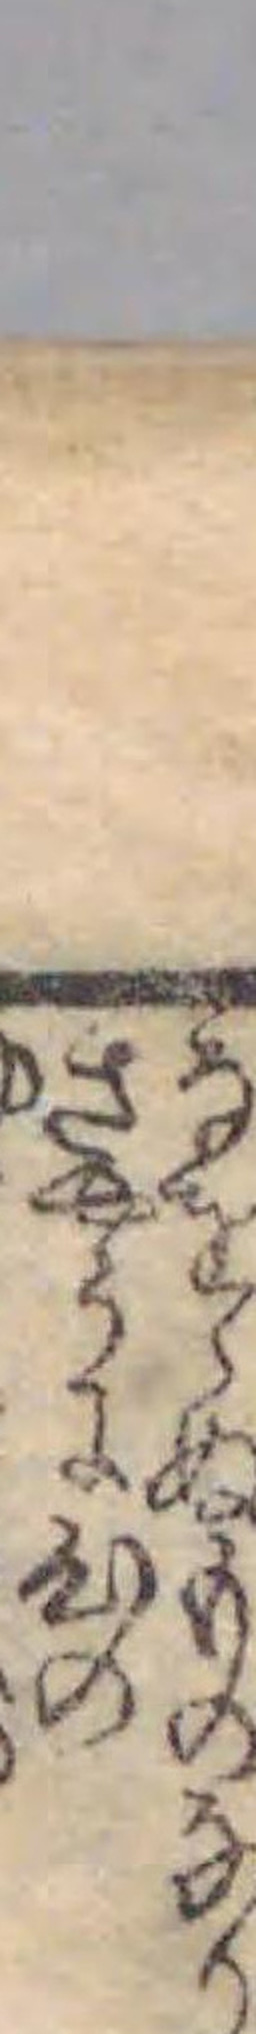さやうに心の
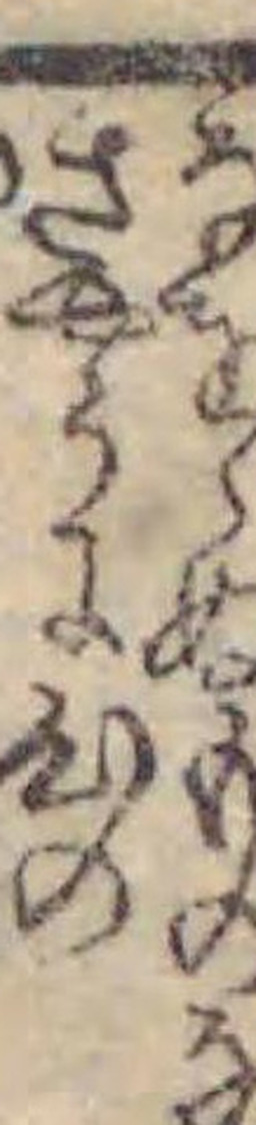さやうに心の
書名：人心鏡写絵 : 3巻
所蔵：国立国会図書館 National Diet Library, JAPAN
